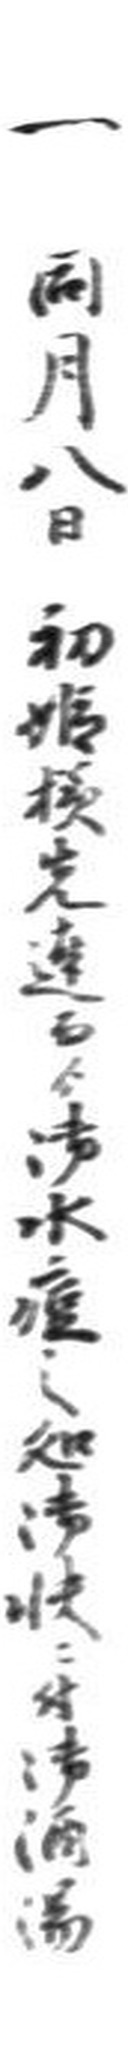一同月八日初姫様先達而ゟ御水痘之処御快ニ付御酒湯
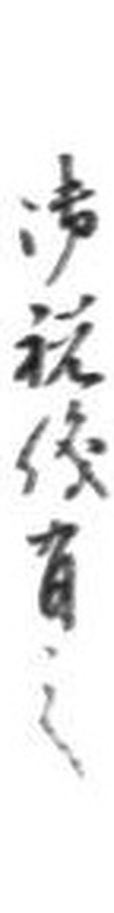御祝儀有之
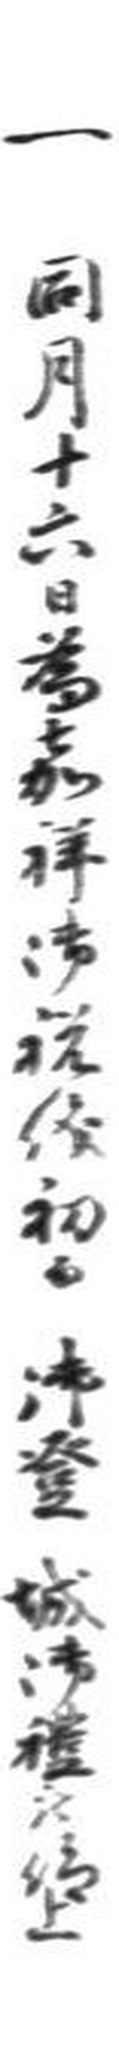一同月十六日為嘉祥御祝儀初而御登城御礼被仰上
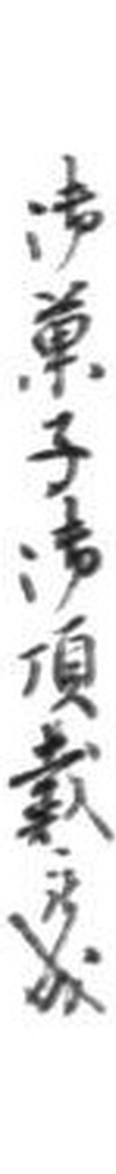御菓子御頂戴被成

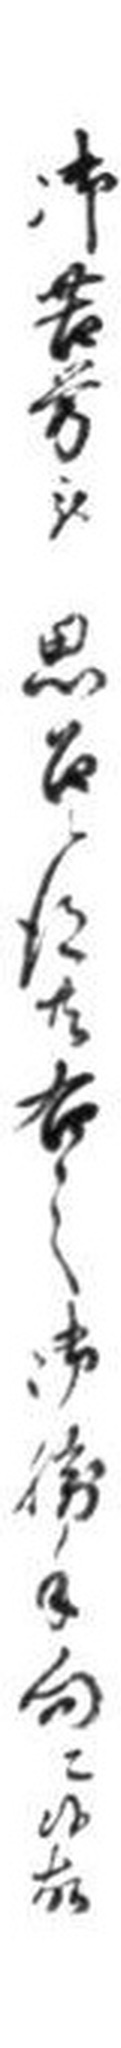御苦労被思召候得共右之御勝手向ニ候故
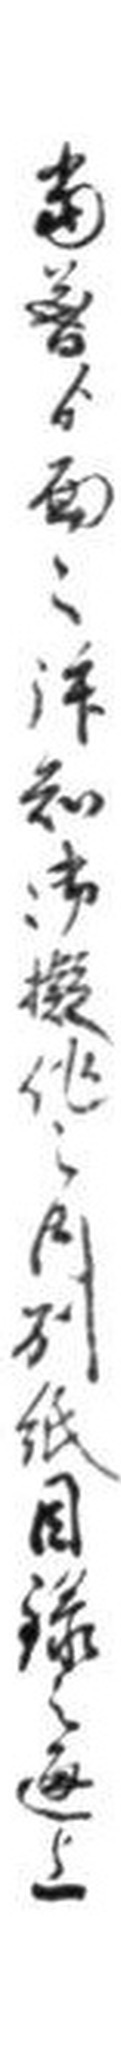当暮ゟ面拝知御擬作之内別紙目録之通上
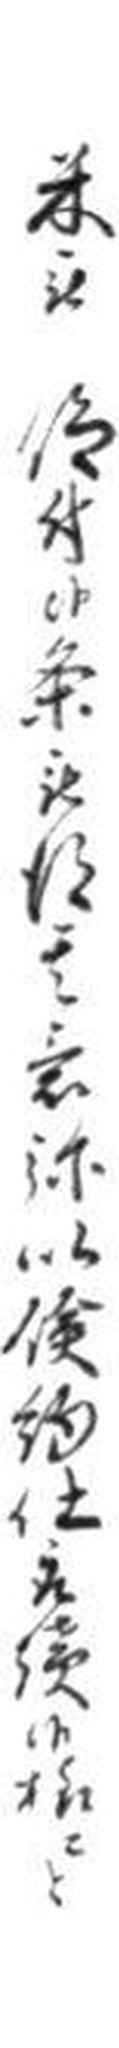米被仰付候条被仰其意弥以倹約仕被続候様ニと
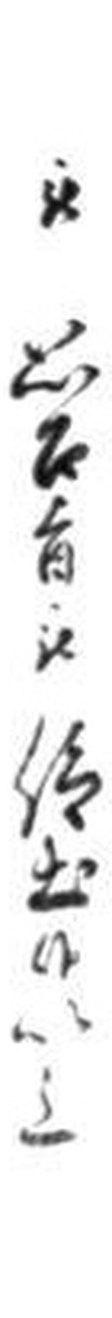被思召旨被仰出候以上
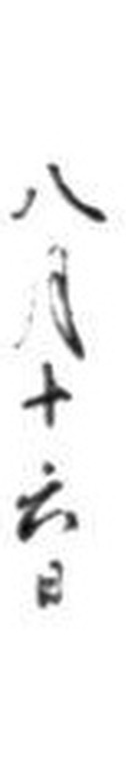八月十六日
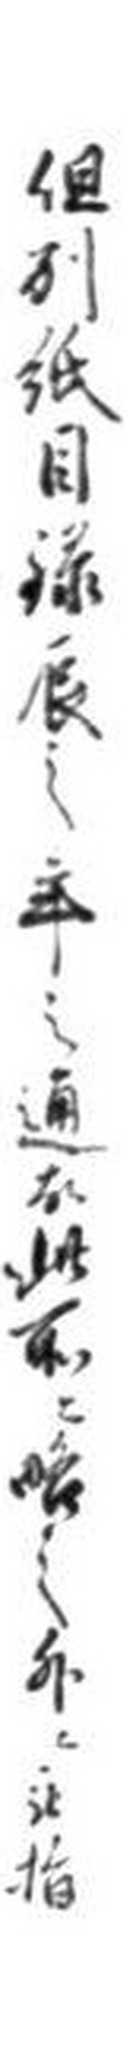但別紙目録辰之年之通故此所ニ略之外ニ被指
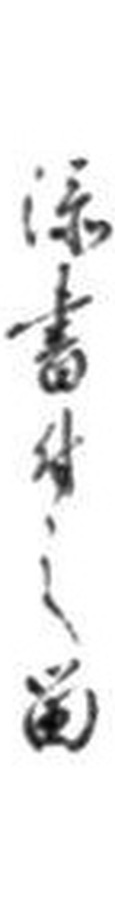添書付之留
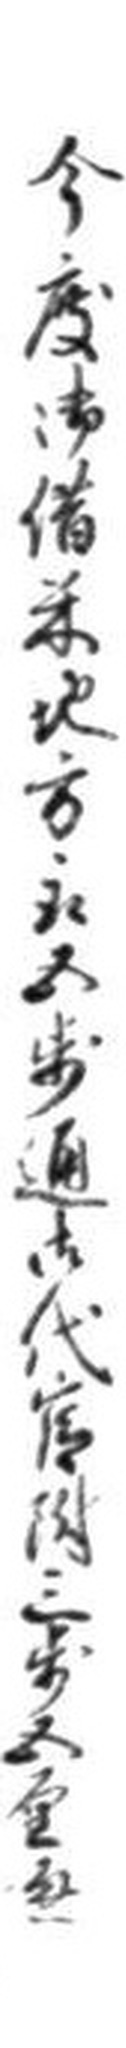今度御借米地方取五歩通御代官附三歩五厘通
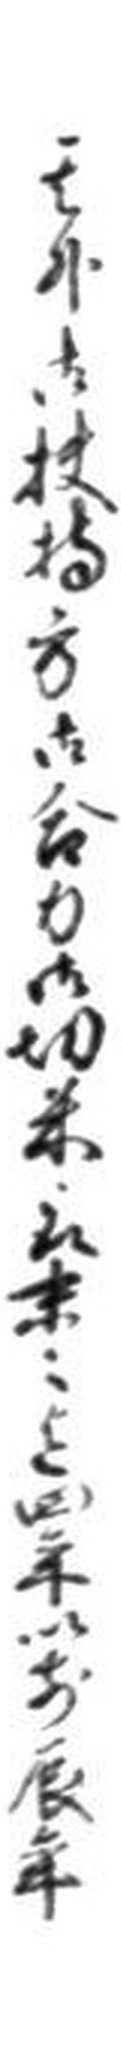其外御扶持方御合力御切米取末々迄四年以前辰年
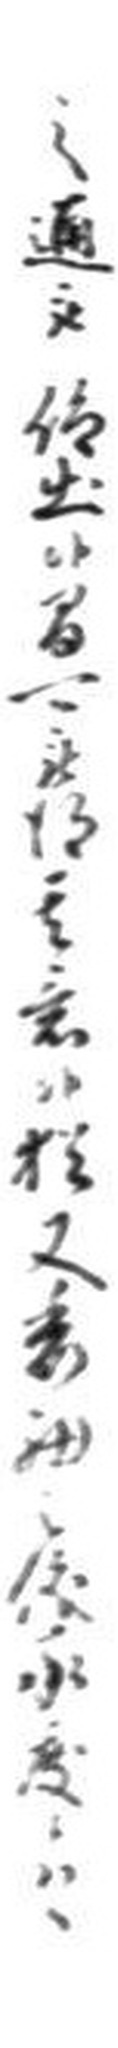之通被仰出候間可被仰其意ハ猶又委細之儀承度候ハヽ
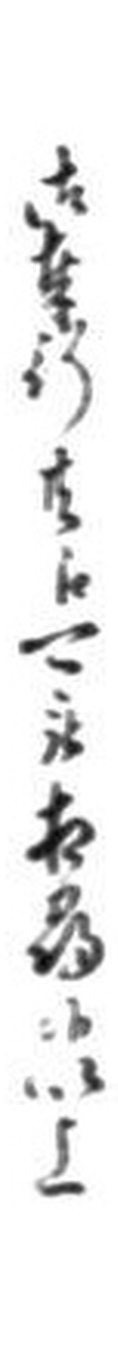御奉行共江可被相尋候以上
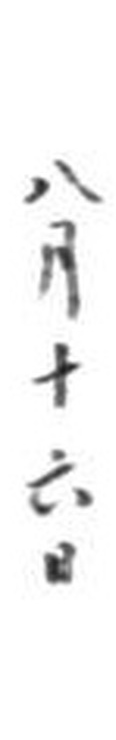八月十六日
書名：家譜 四十 宗矩公 従享保十一年到享保十二年
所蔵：福井県文書館 Fukui Prefectural Archives
